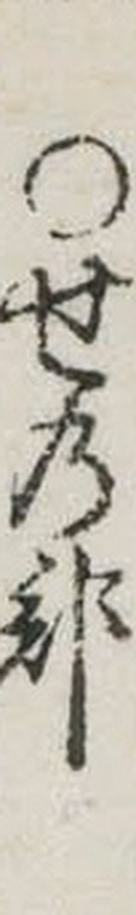○せの部
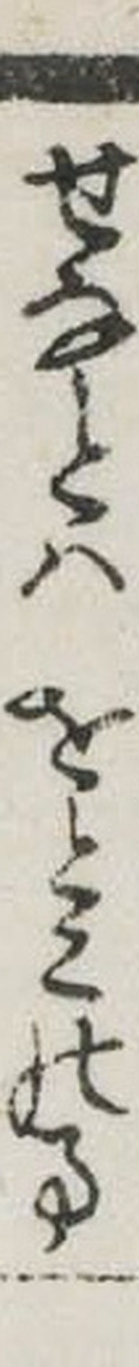せなとはをとこの事
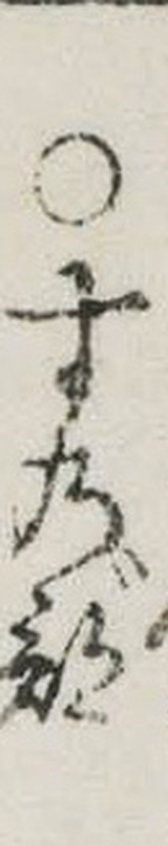○すの部
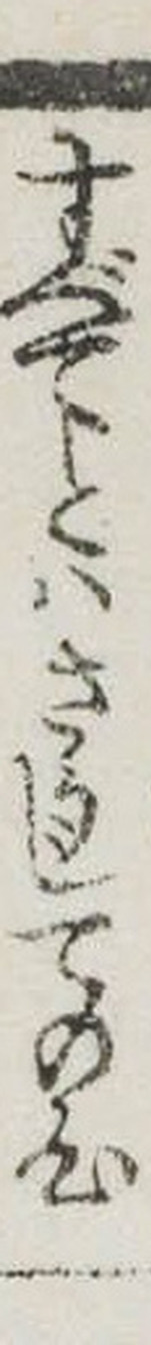すべてとはさうじての心
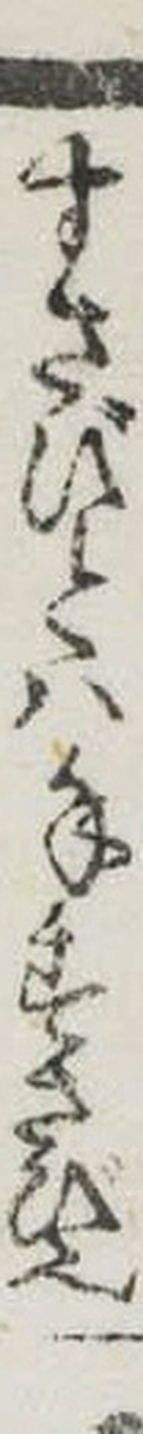すさびとは手すさび也
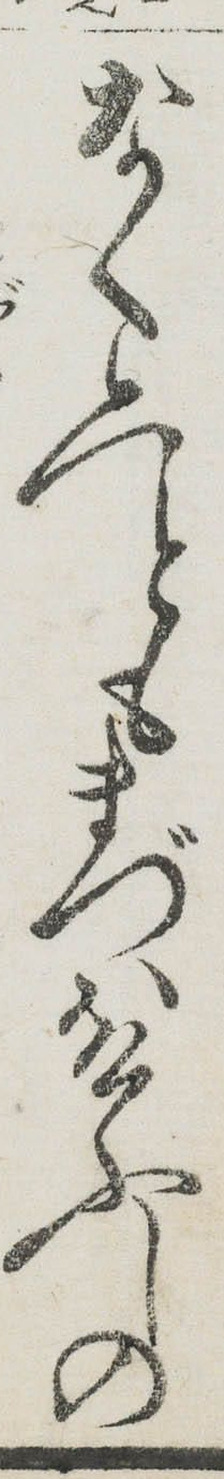なく候へともまづはけふしの
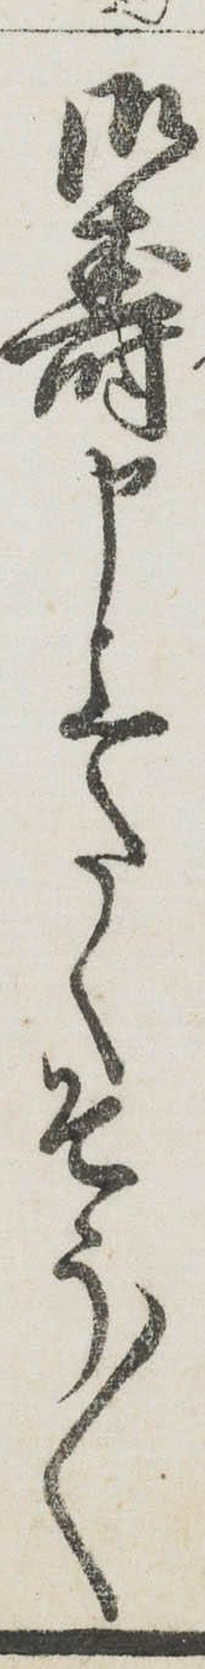御寿申上たくそう〳〵
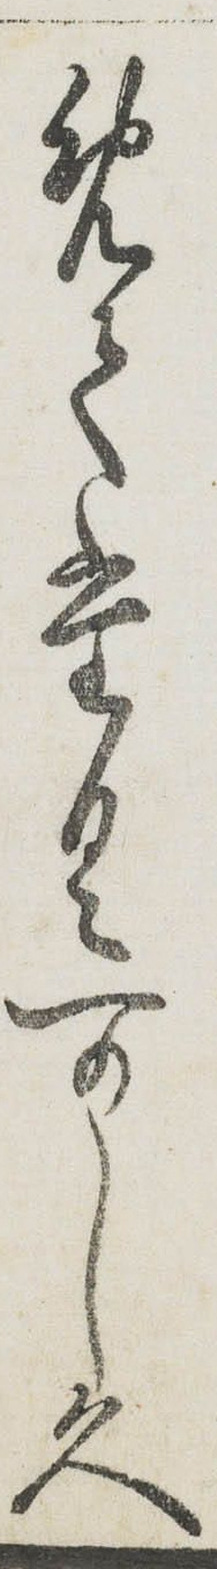めてたくかしく
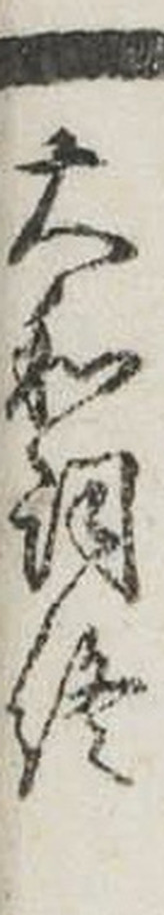大和詞終
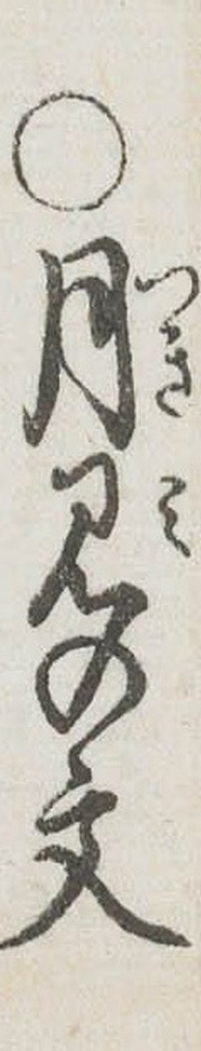○月見の文
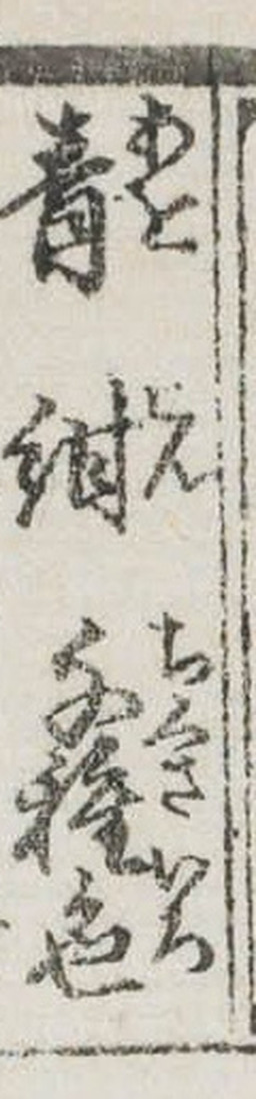青紺千種色
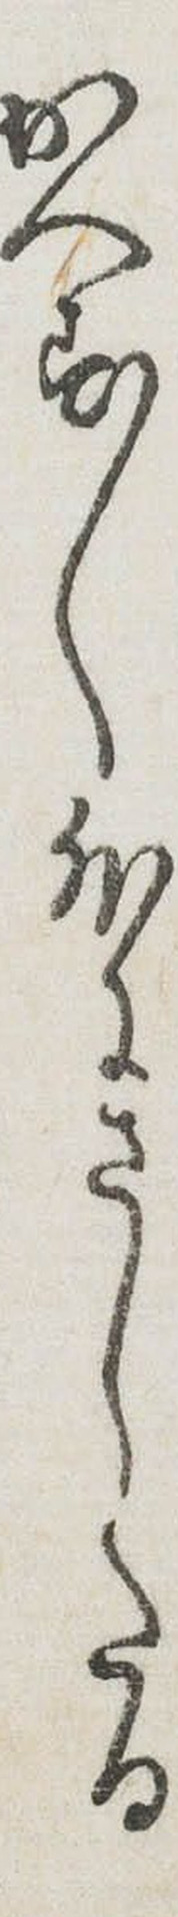かへす〳〵外にさしたる
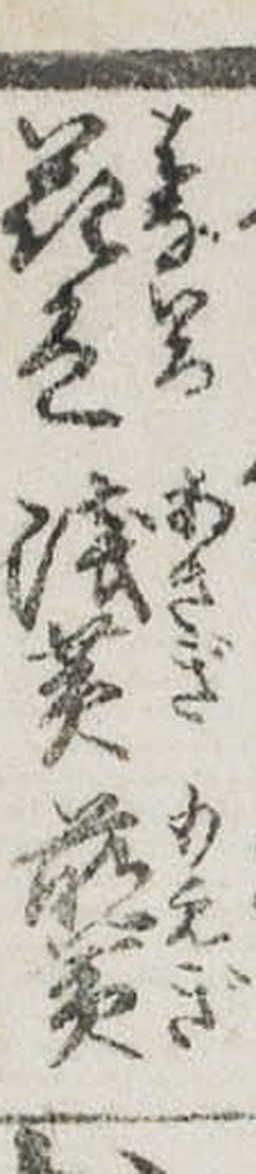花色浅黄萌黄
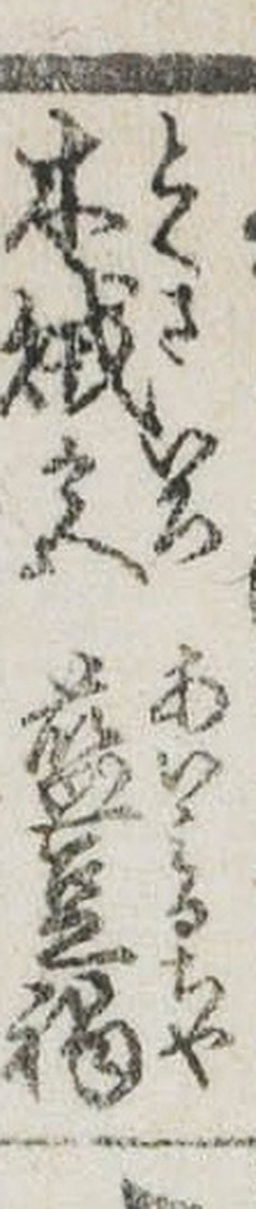木賊色藍豆褐
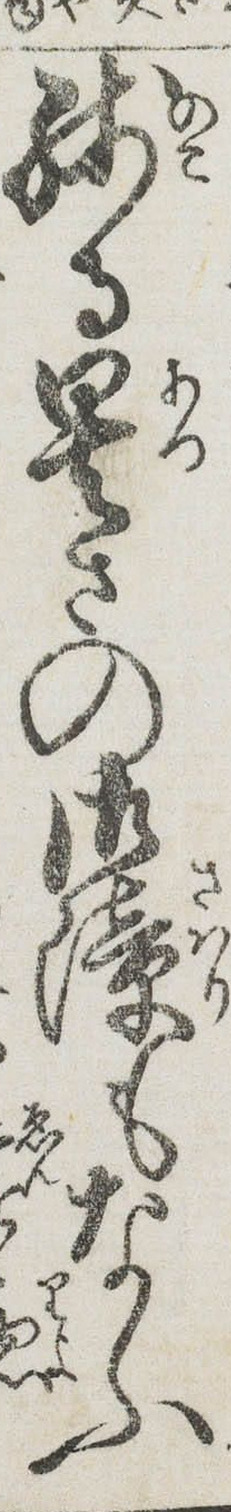残る暑さの御障もなふ
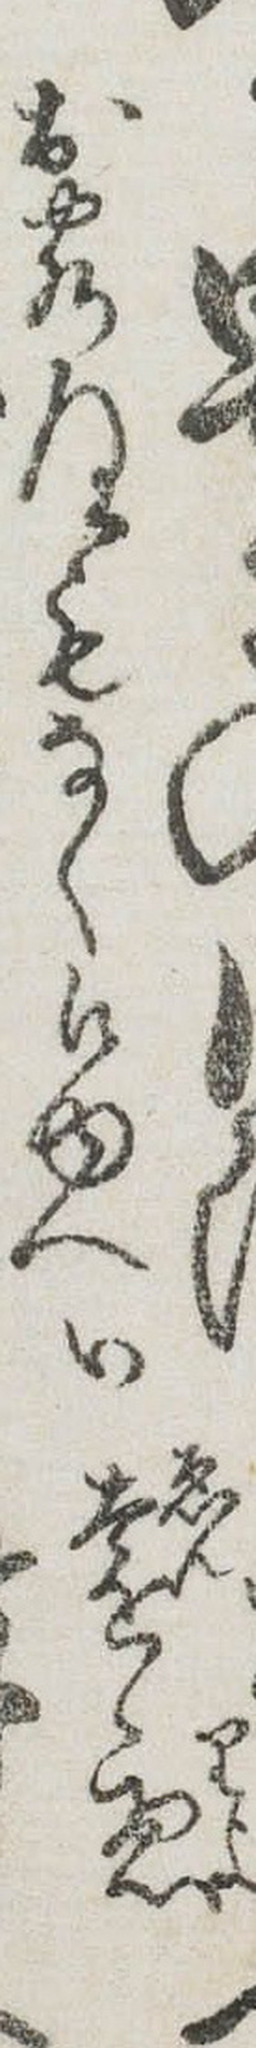お客さまもなく候ゆへ御遠慮
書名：頭書萬用婦人手紙之文言
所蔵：東京学芸大学教育コンテンツアーカイブ
